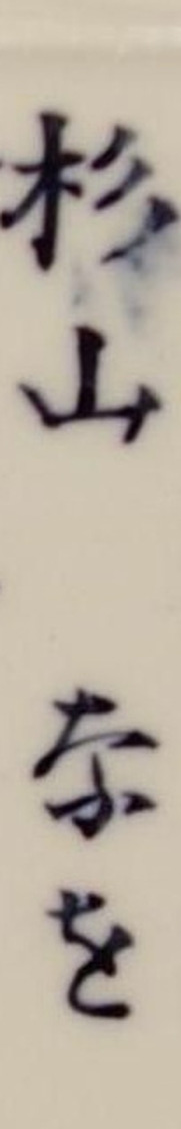杉山なを
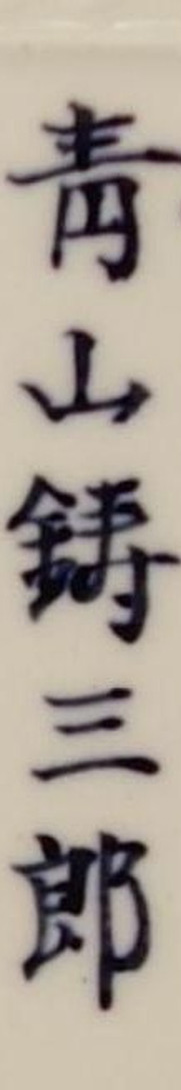青山鋳三郎
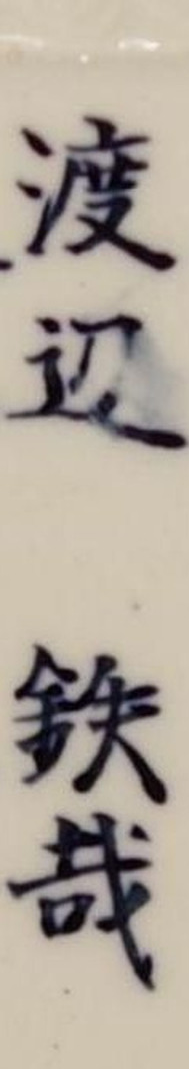渡辺鉄哉
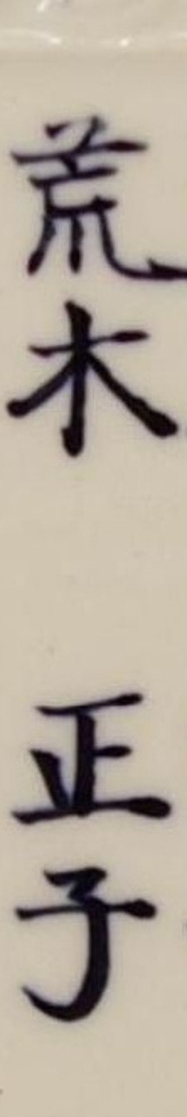荒木正子
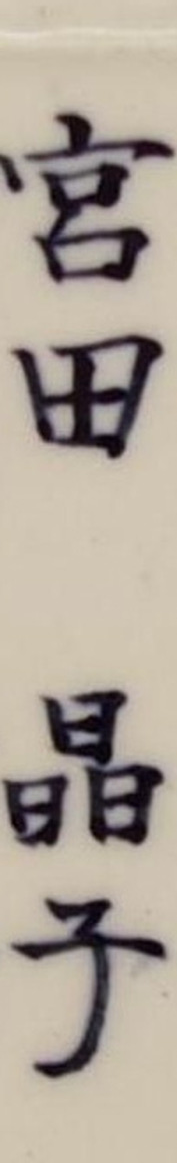宮田晶子
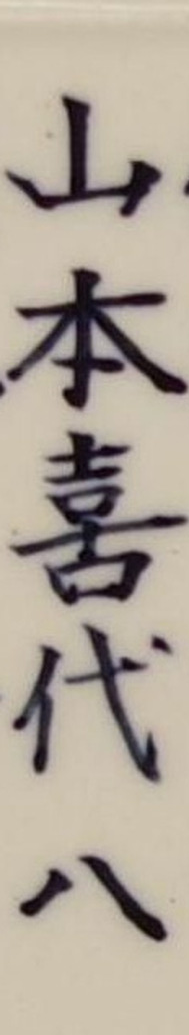山本喜代八
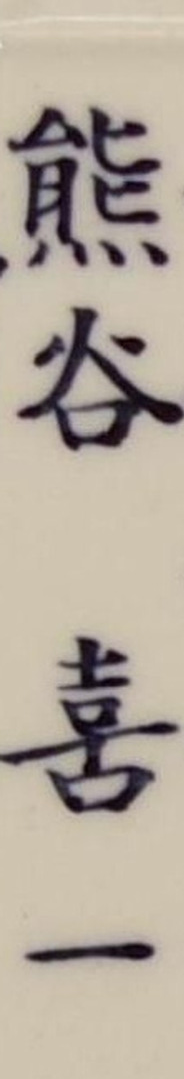熊谷喜一
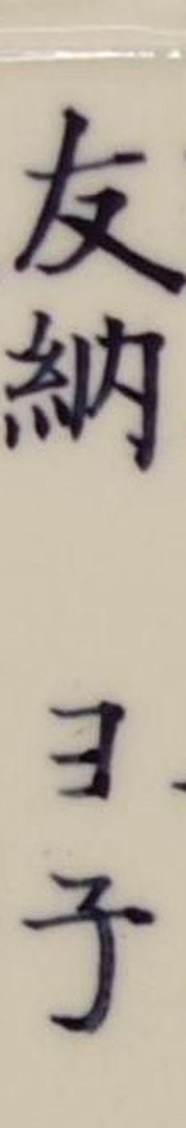友納ヨネ
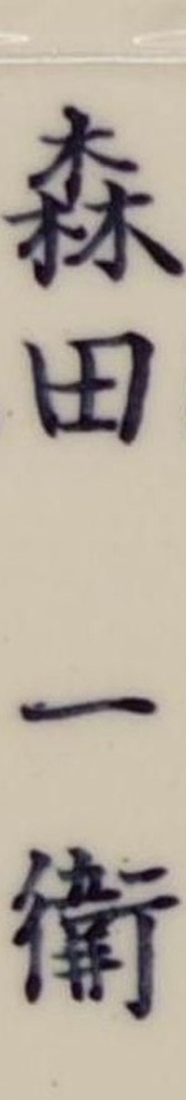森田一衛
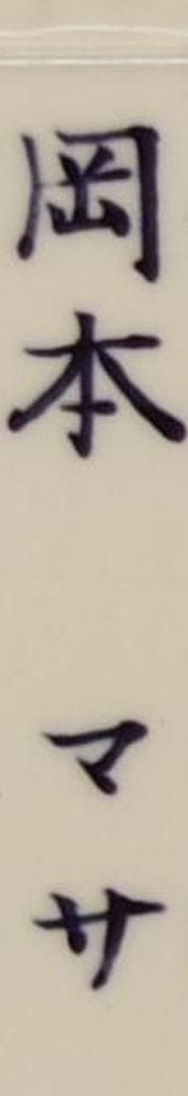岡本マサ
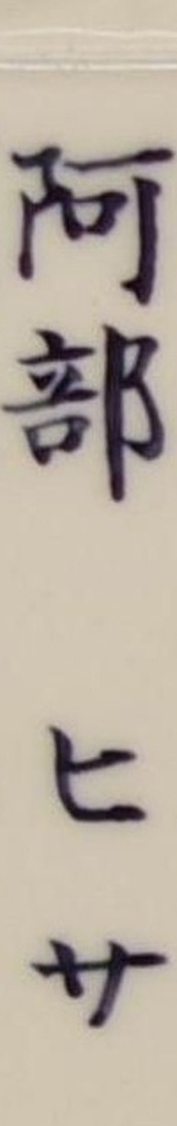阿部ヒサ
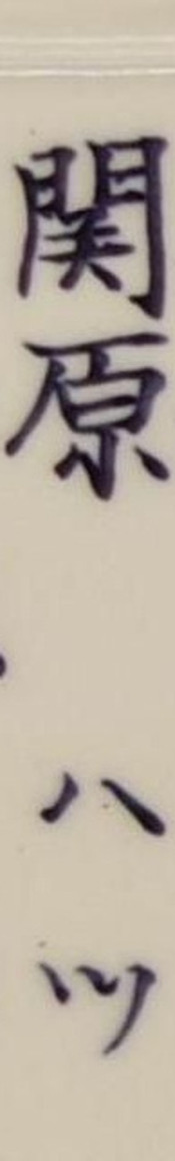関原ハツ
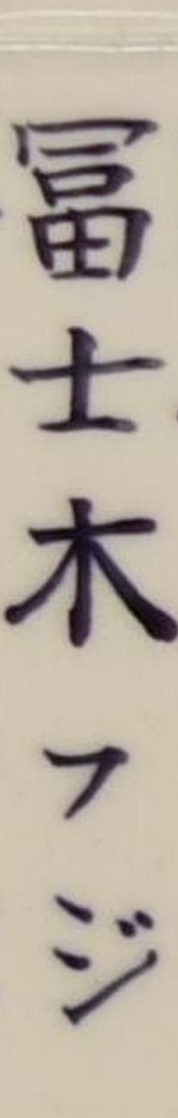冨士木フジ
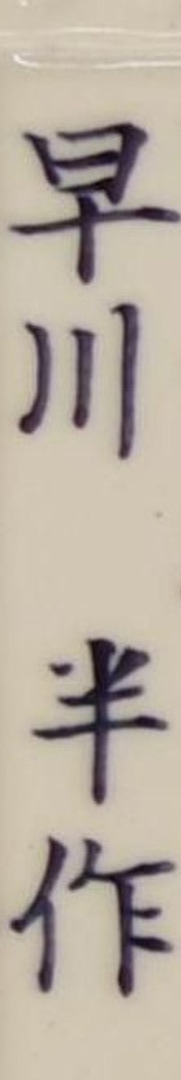早川半作

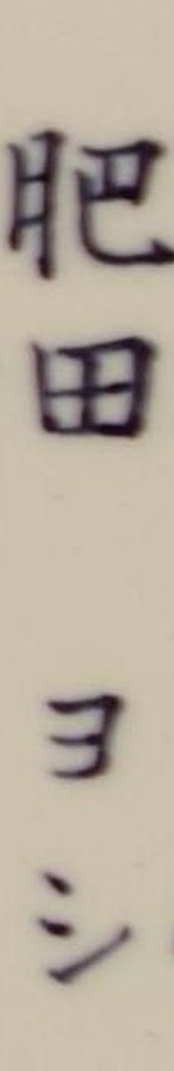肥田ヨシ
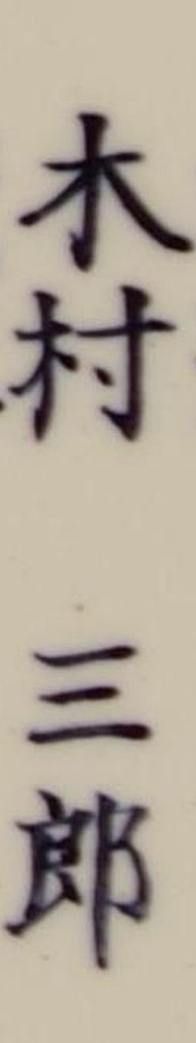木村三郎
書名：M~S
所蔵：高野山金剛峯寺
